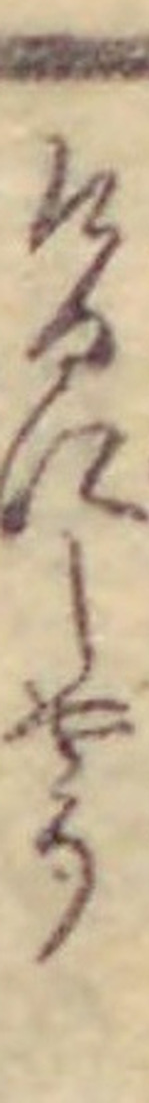けるにしやう
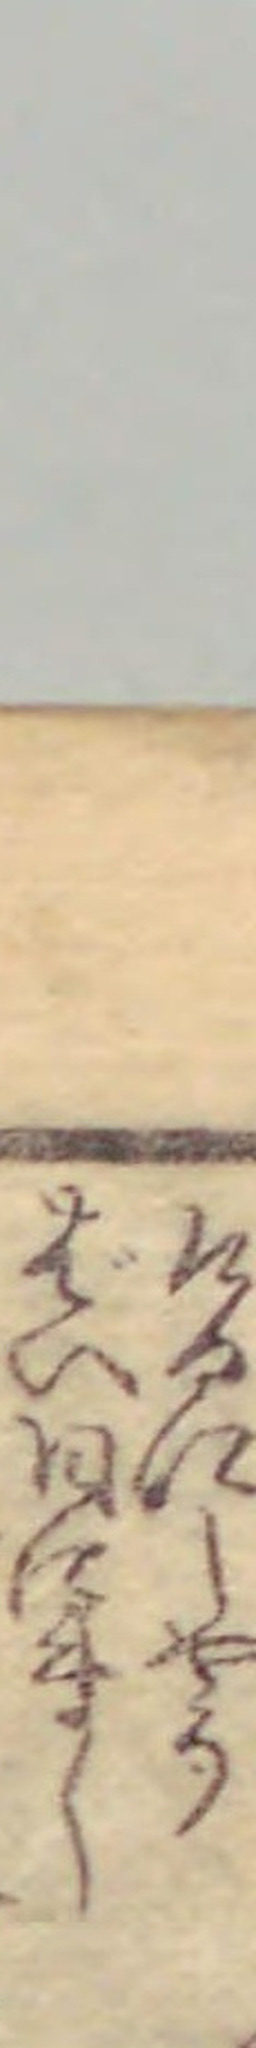ばい日にまし
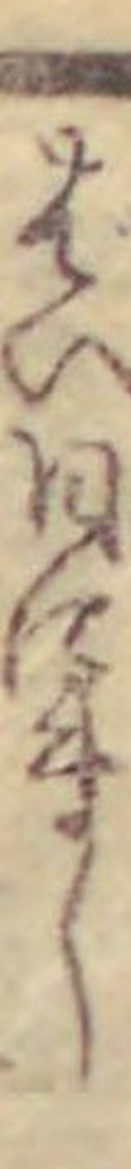ばい日にまし
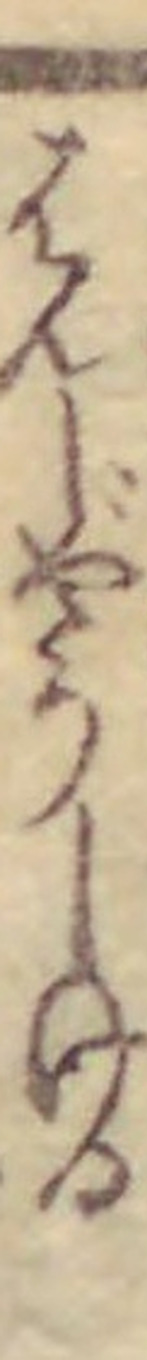はんじやうしける
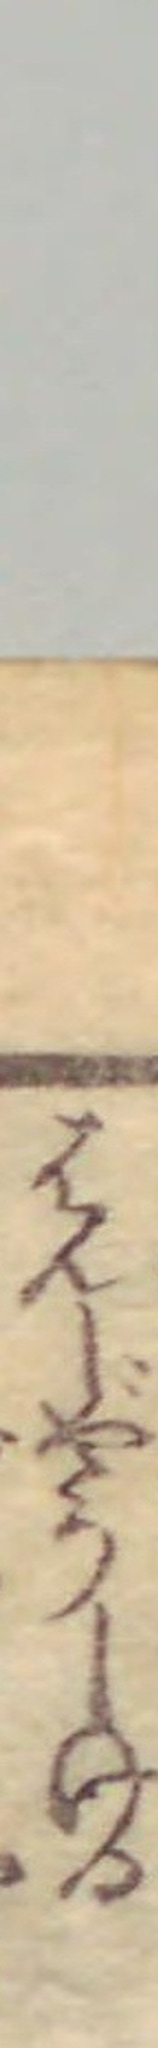はんじやうしける
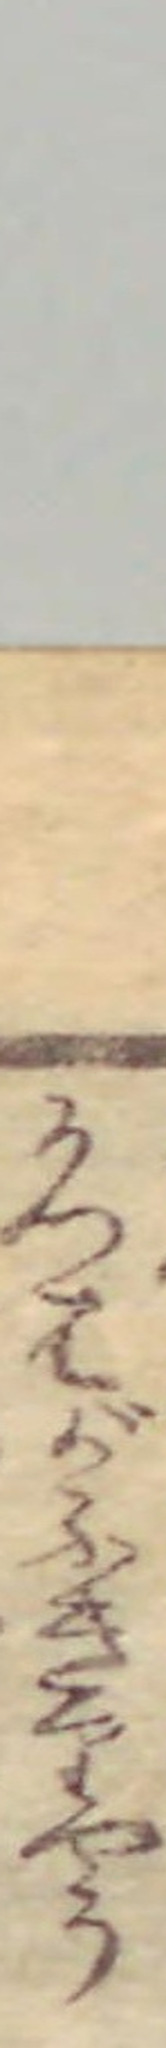かつはがふきりやう
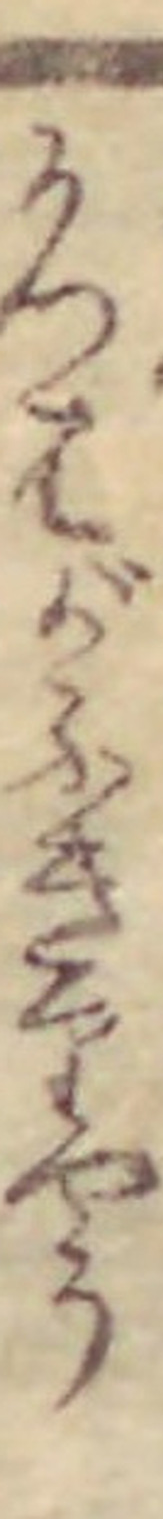かつはがふきりやう
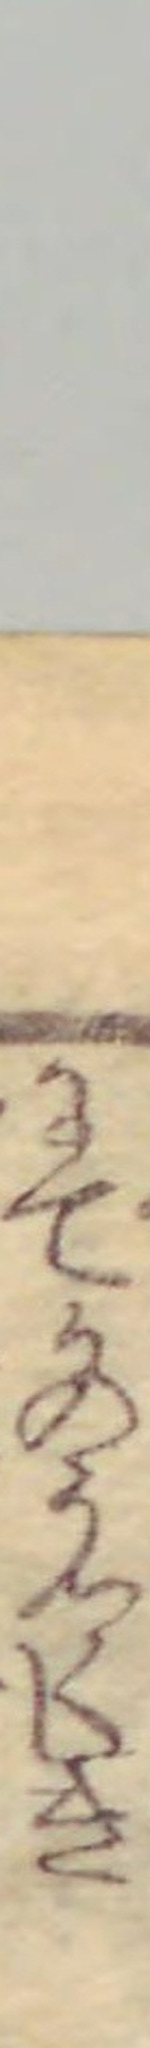にてかのうつくしき
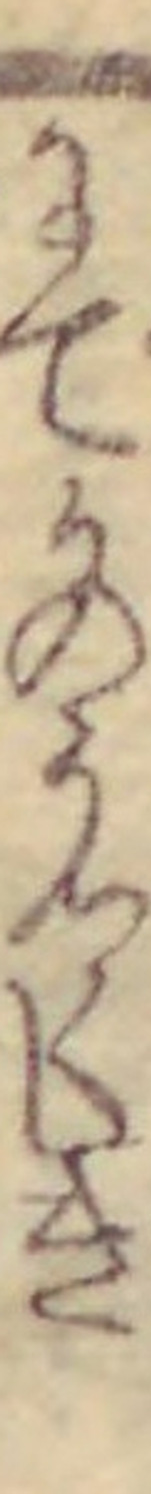にてかのうつくしき
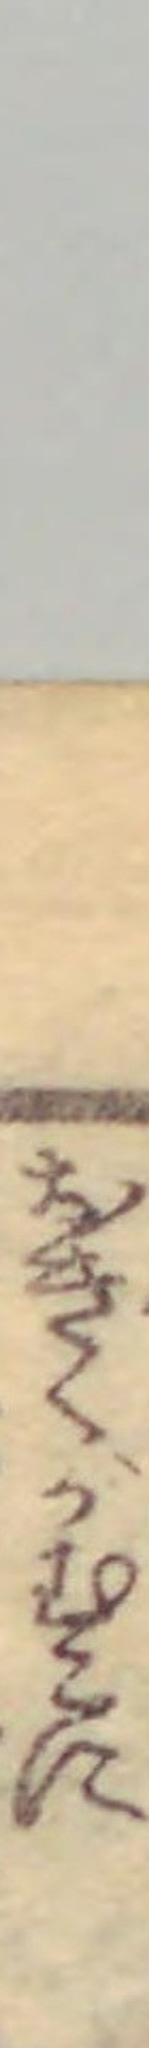おきくかむこに
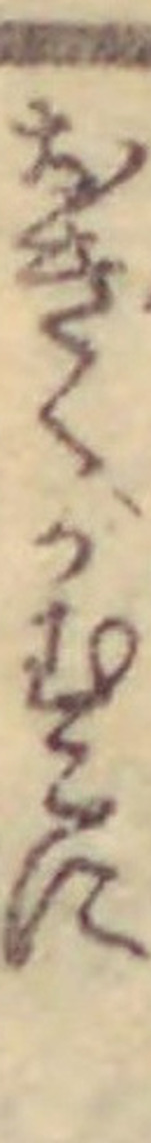おきくかむこに
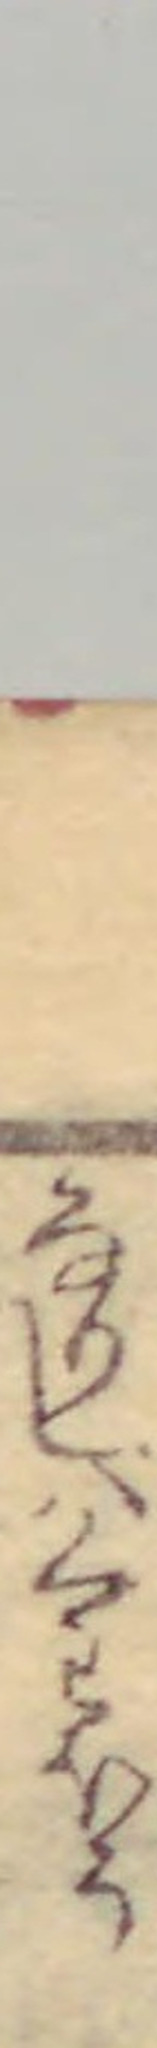なりしはくわほう
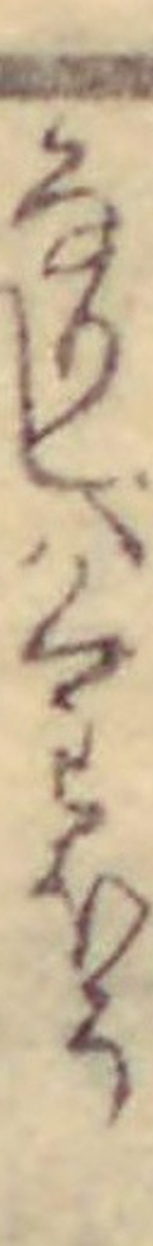なりしはくわほう
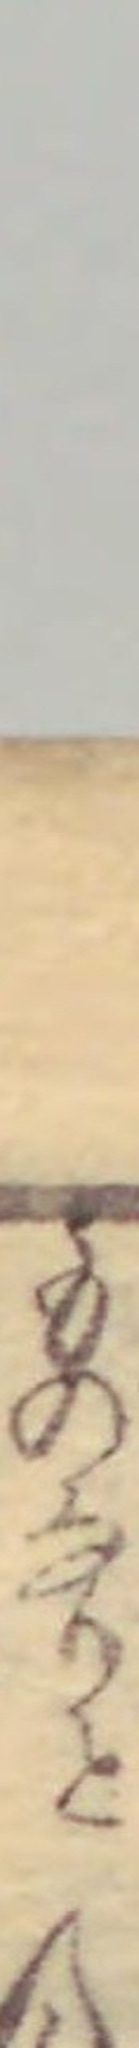ものなりと
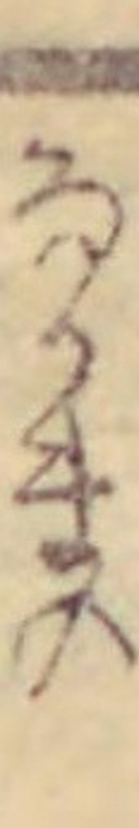なかまの
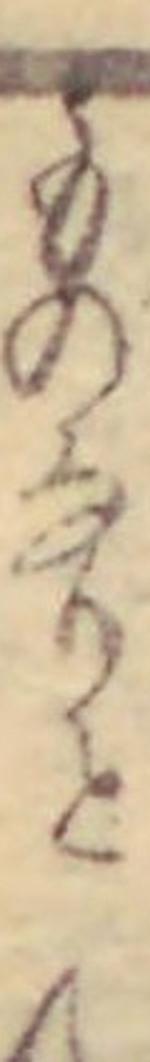ものなりと
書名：化物世帯氣質
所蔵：国立国会図書館 National Diet Library, JAPAN
